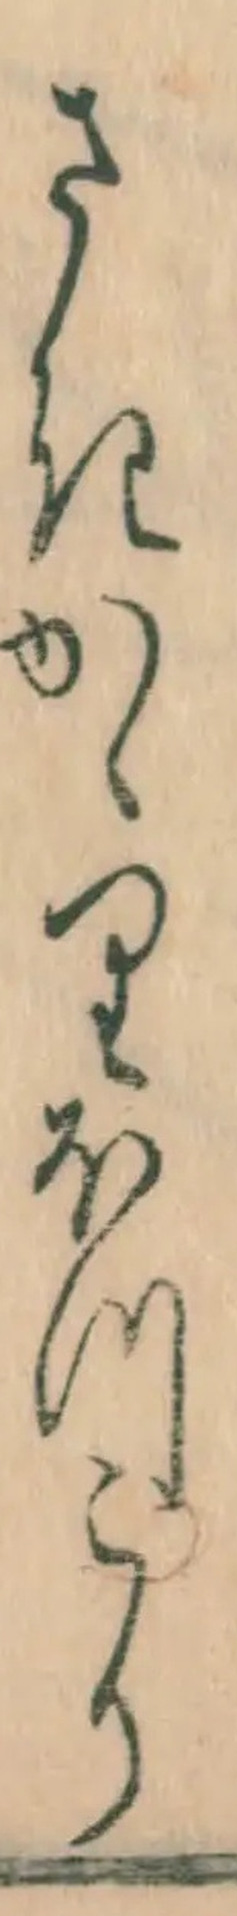さきかゝりほつこり
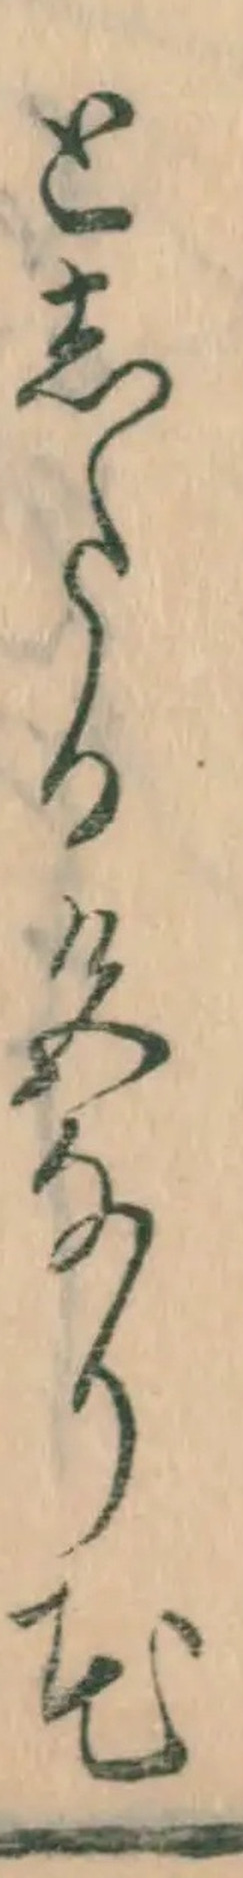としたる色なり花
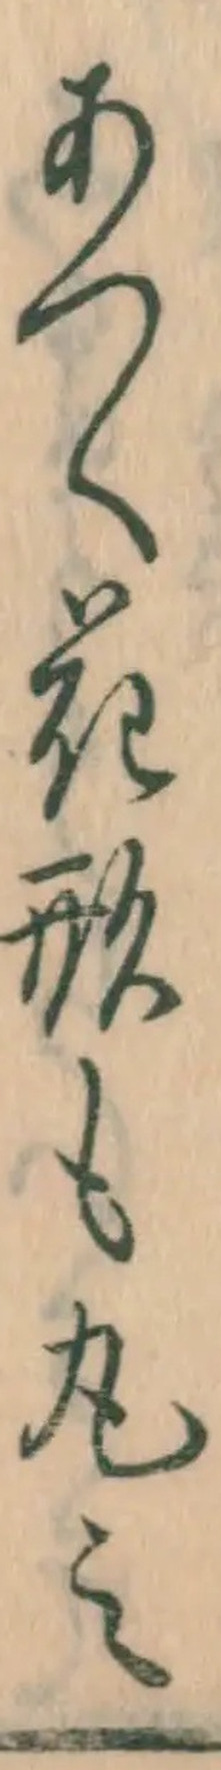あつく花形も丸み
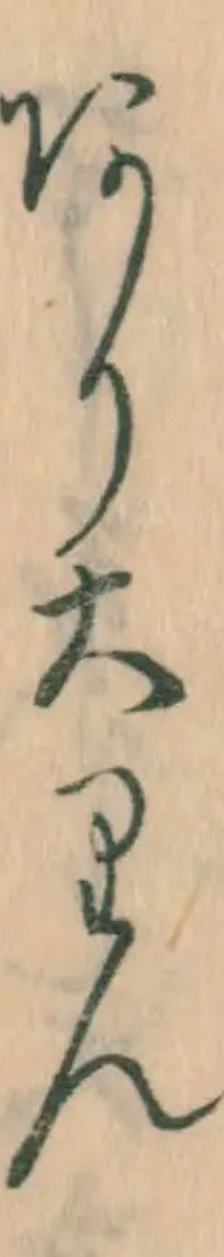なり大りん
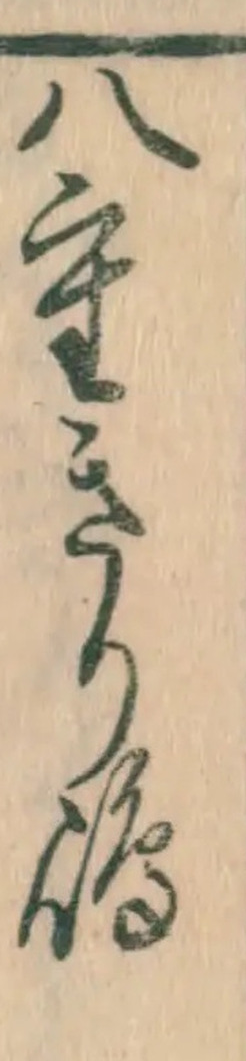八重きり嶋
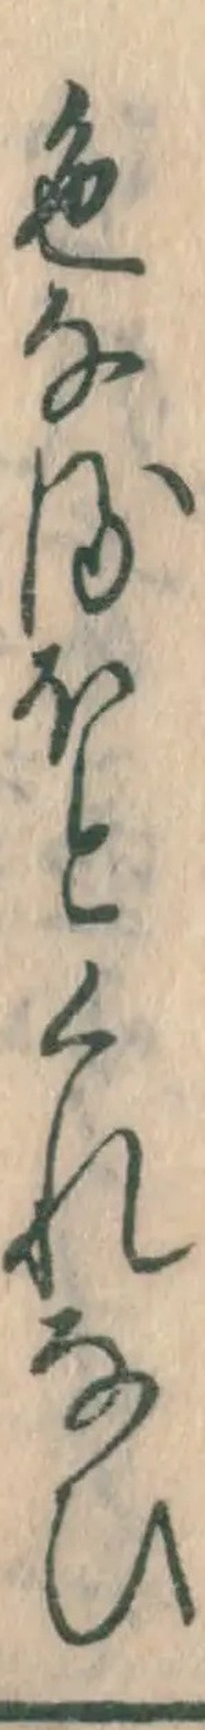色なるほとくれなひ
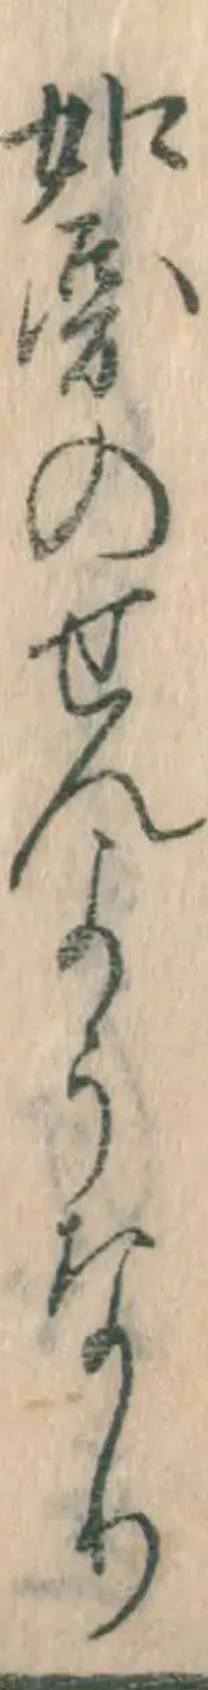如図のせんようなり
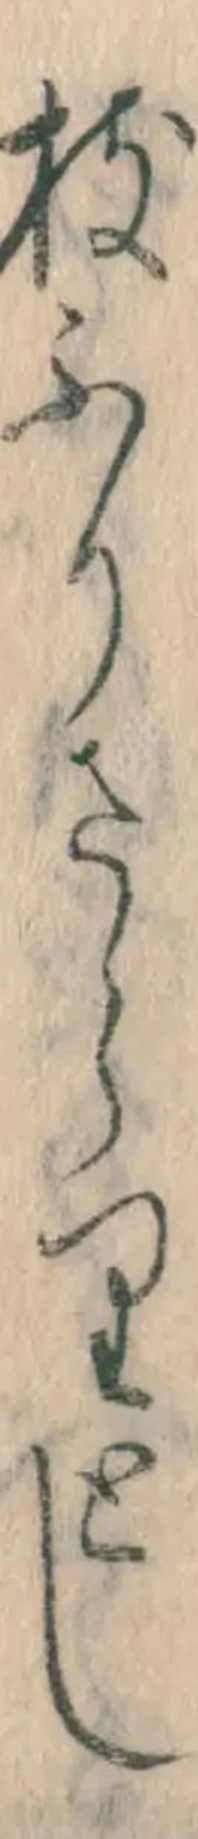枝ふりさらりとし
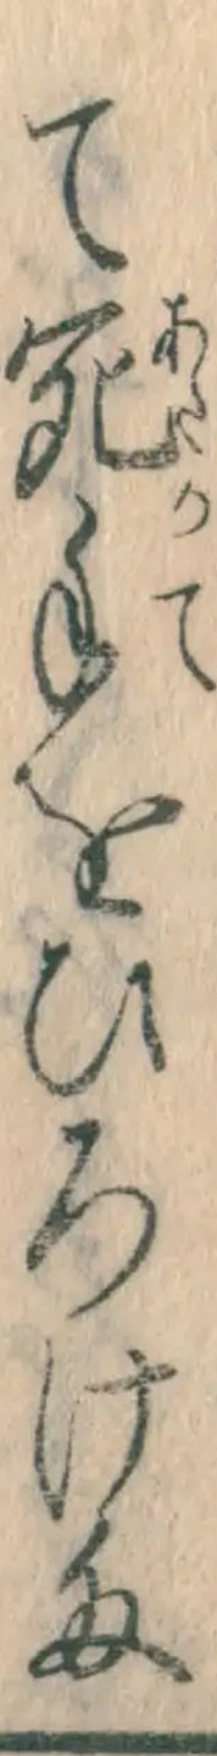て宛手をひろけた

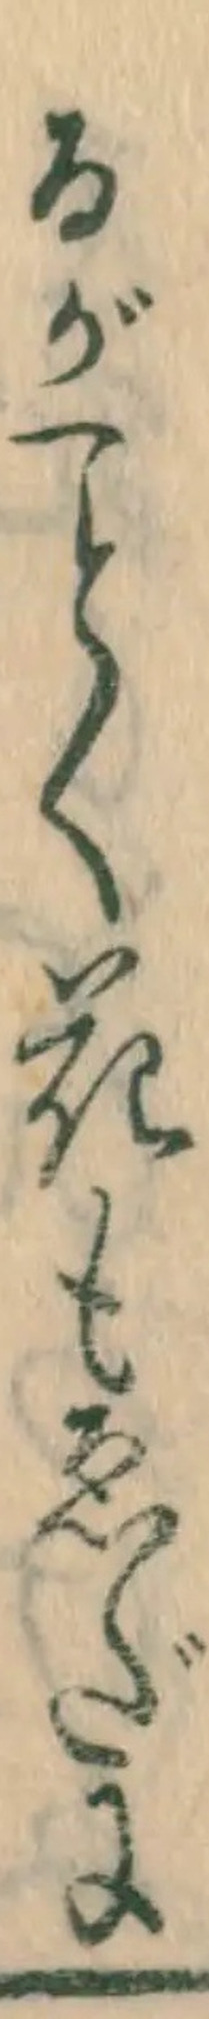るがことく花もゑだに
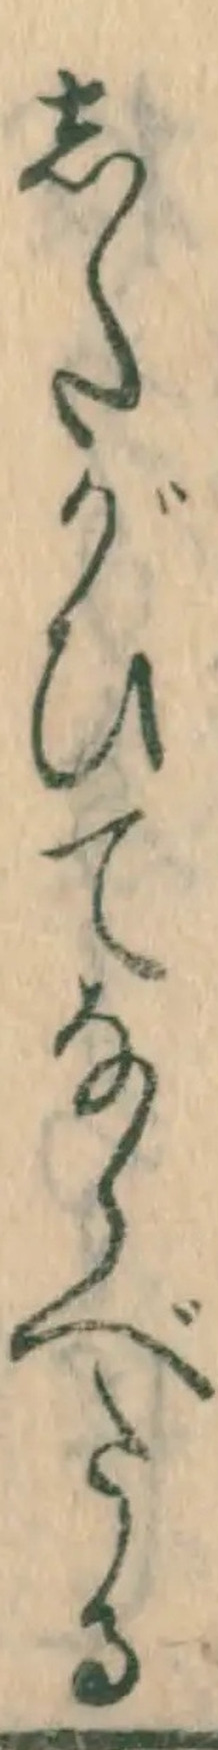したがひてならべたる
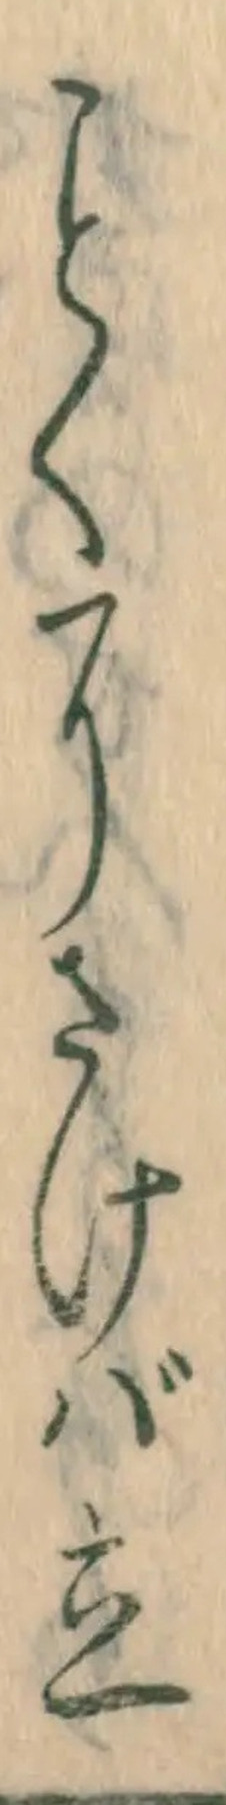ことくにさけば立
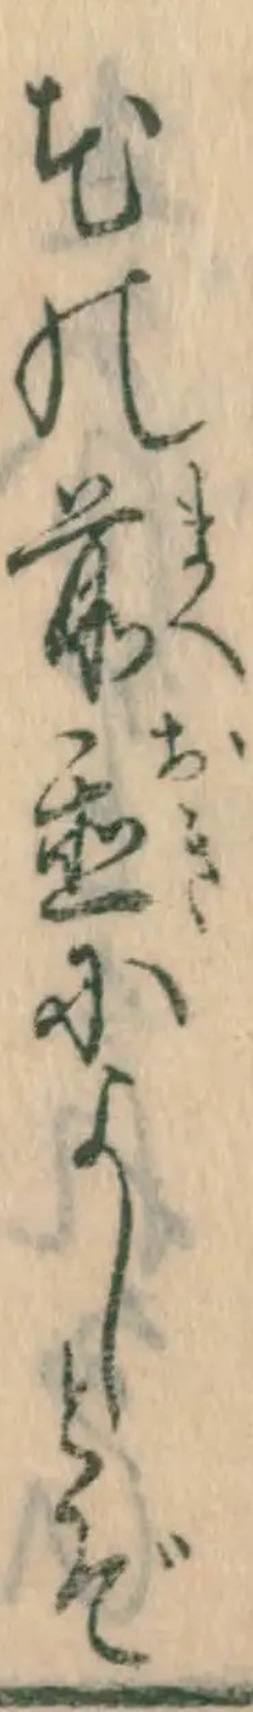花の前置によしとぞ
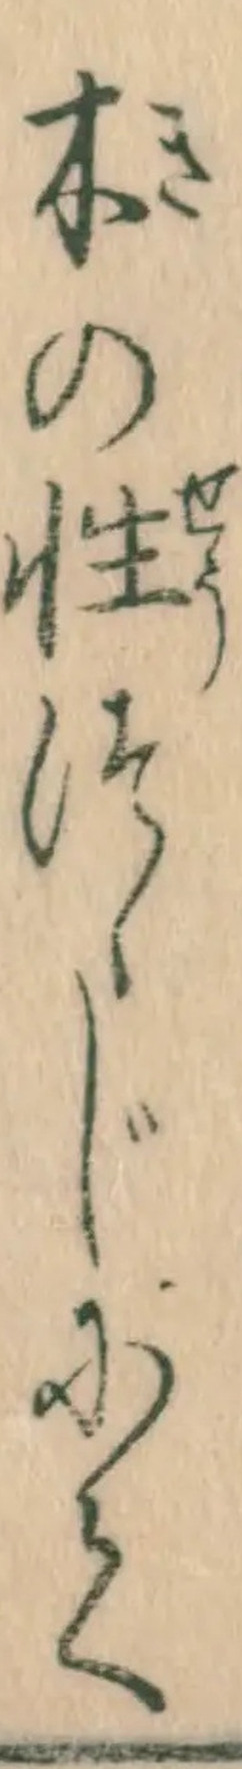木の性つゝじにて
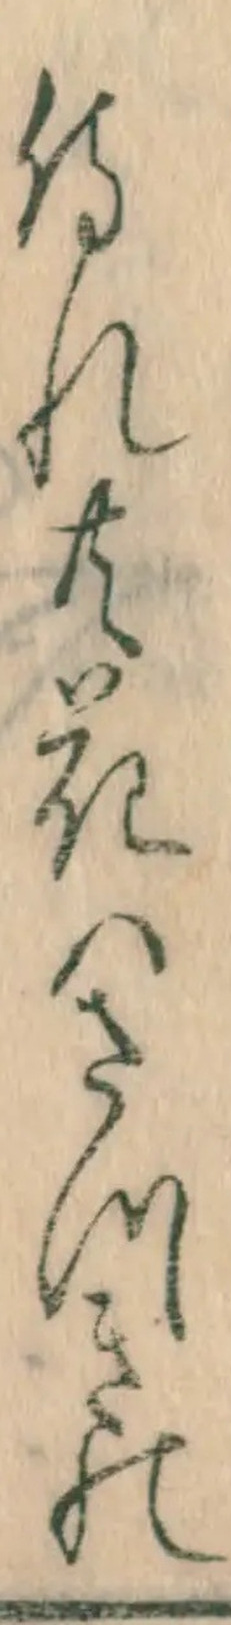侍れ共花はさつきの
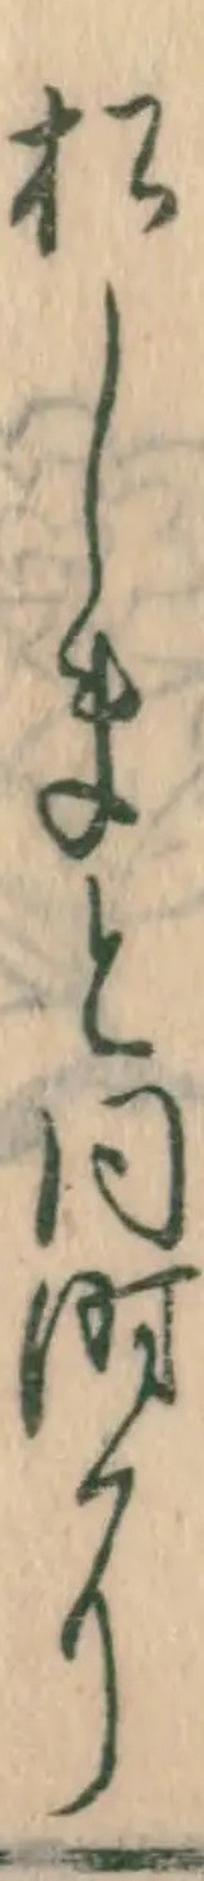松しまと同時に
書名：錦繍枕 5巻. [1]
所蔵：国立国会図書館 National Diet Library, JAPAN
